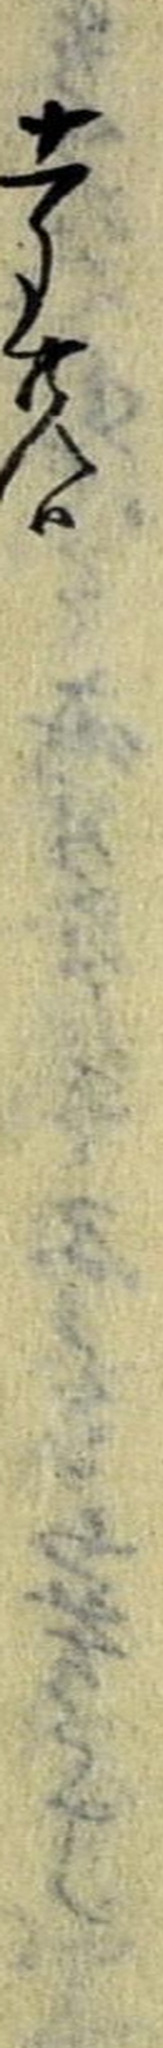十一月廿八日
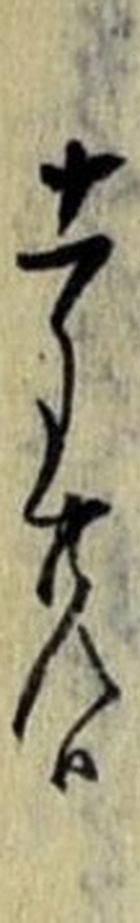十一月廿八日
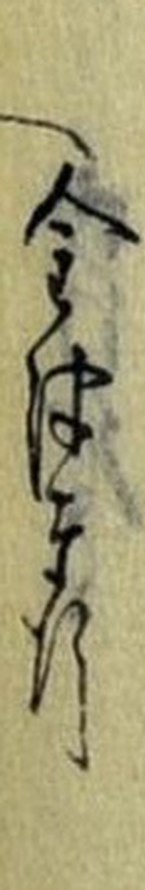金津奉行
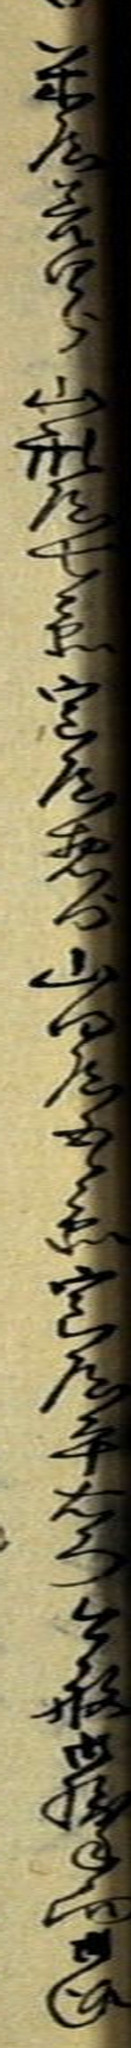○米屋善四郎山形屋七兵衛宝屋惣右衛門山田屋五郎兵衛宝屋平右衛門今般御勝手向御趣
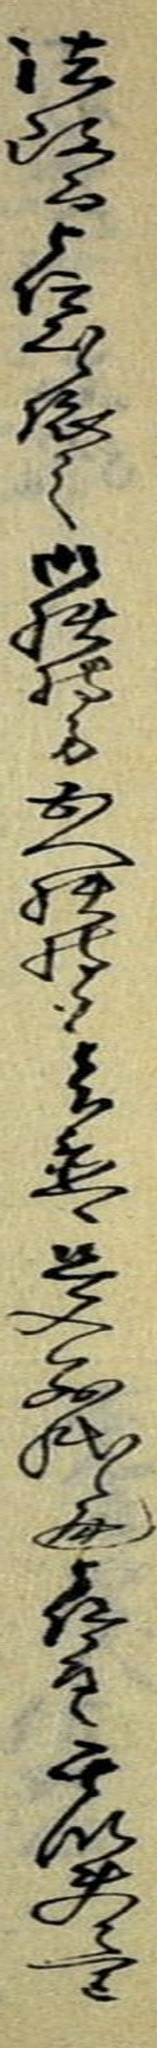法改而被仰出候依之御扶持方五人扶持つヽ被下置候且又別紙之通被仰付候其段夫々可被
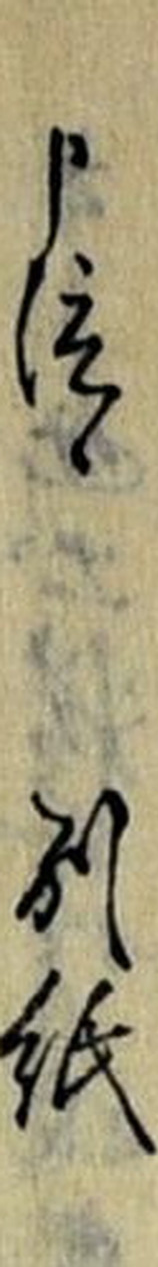申渡候別紙
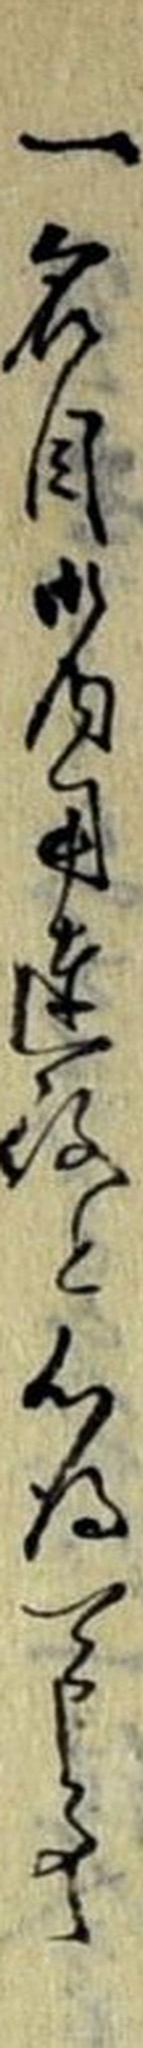一名目御内用達役と心得可申事
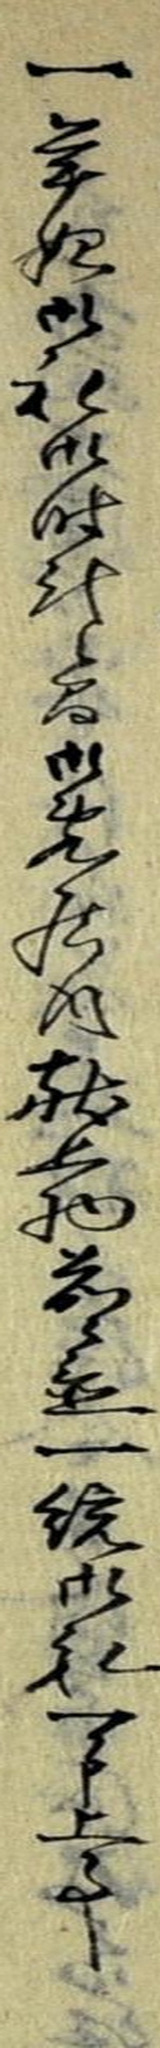一年始御礼御時計之間御敷居内献上物前へ置一統御礼可申上事
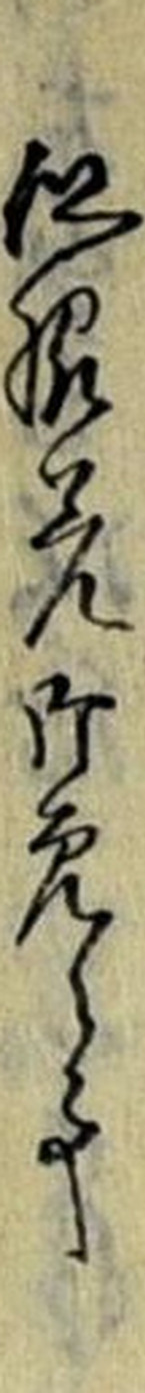但脇差御免之事
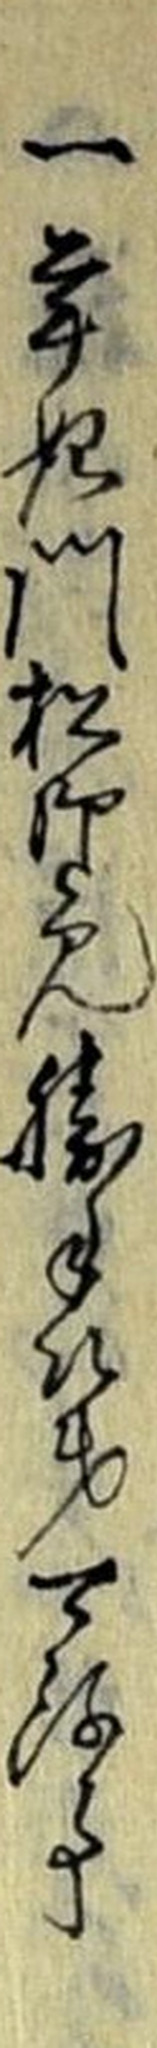一年始門松御免勝手次第可致事
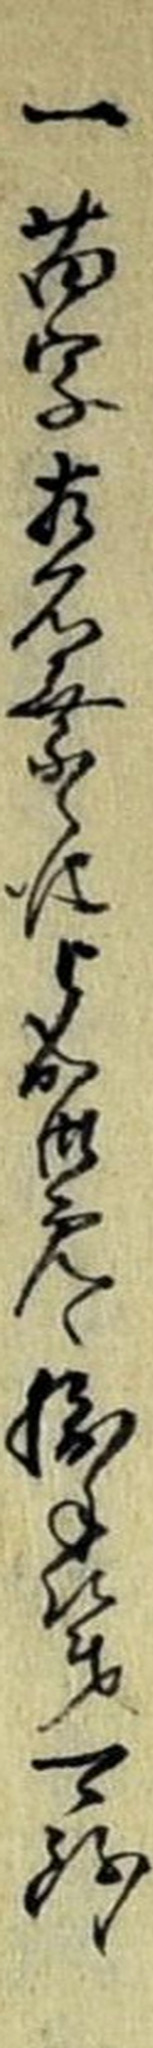一苗字相名乗候儀被成御免勝手次第可致候
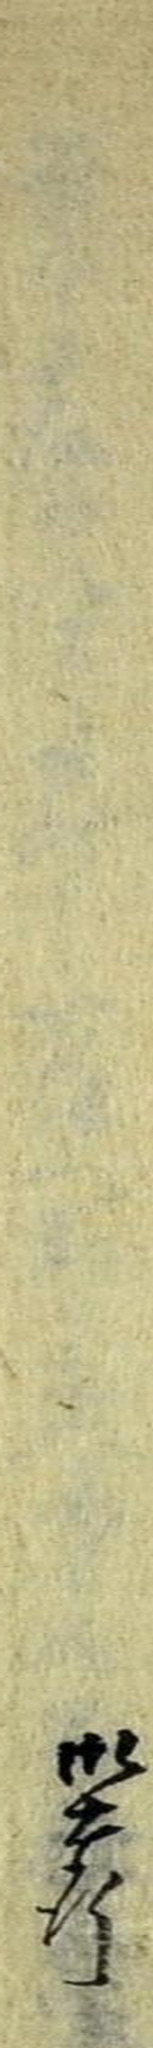御奉行
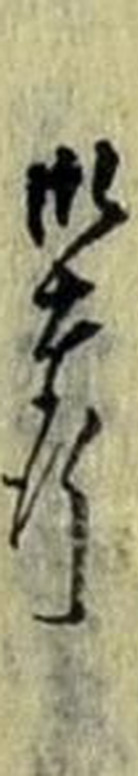御奉行
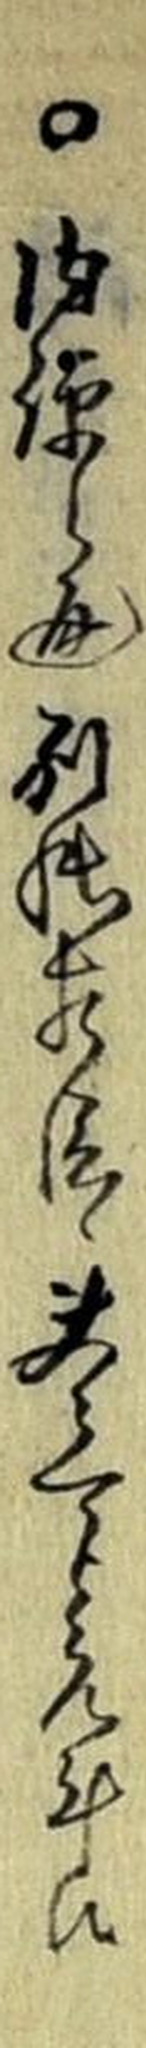一御評之通別紙相渡候夫々可被取斗候
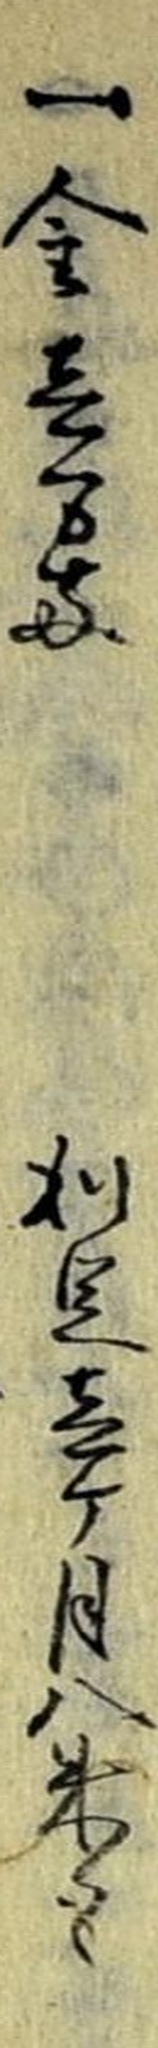一壱万両利息壱ヶ月八朱つヽ
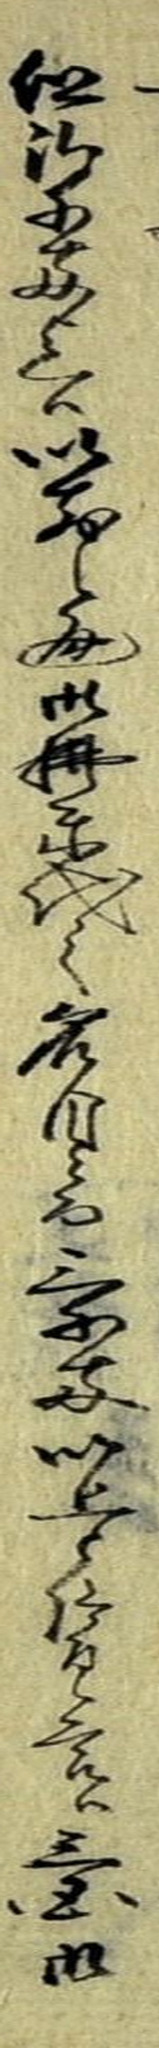但弐千両迄は以前之通御払米代之名目に而三千両以上被仰付候節は三国御
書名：命令之部 四
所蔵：福井県文書館 Fukui Prefectural Archives
